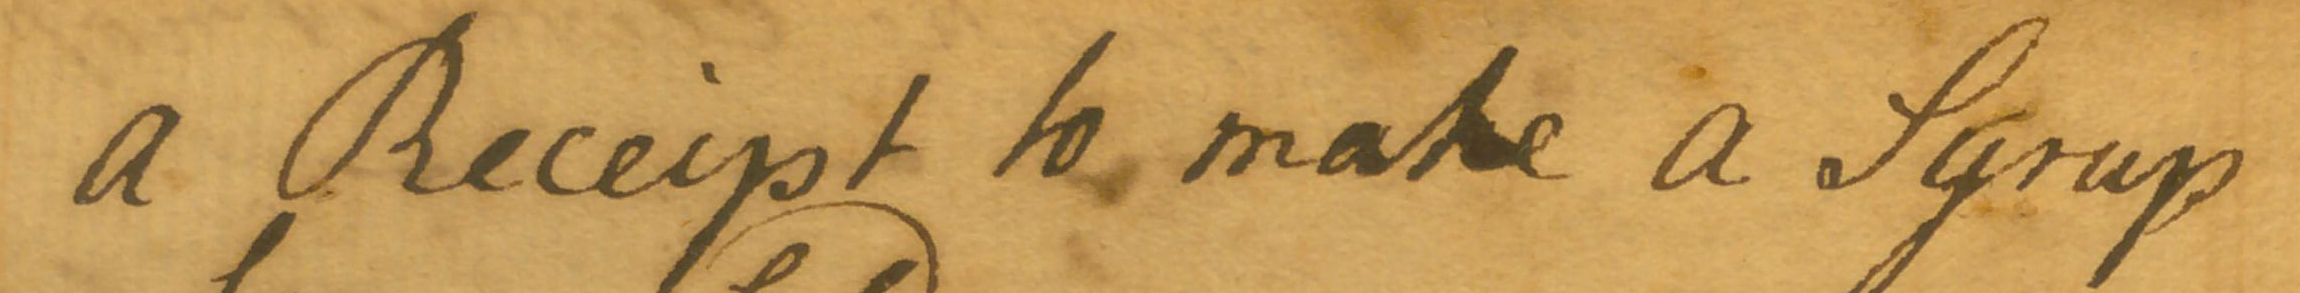a Receipt to make a Syrup
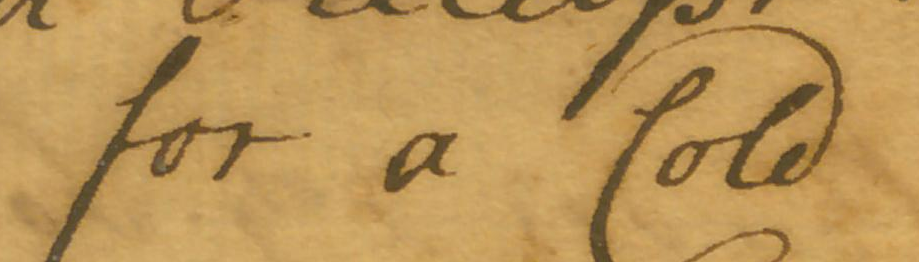for a Cold
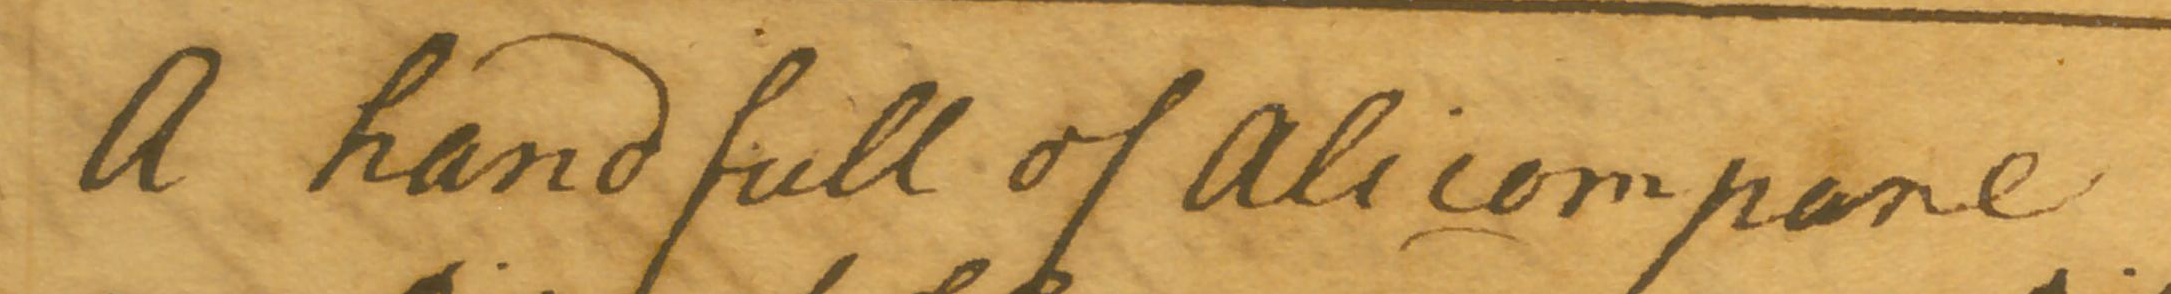A handfull of Alicompane
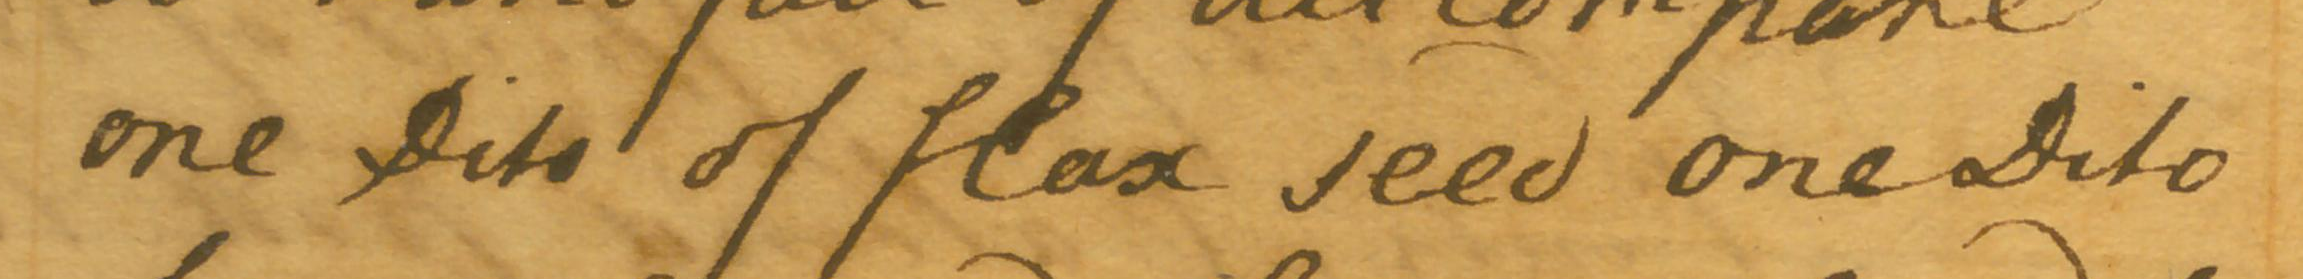one Dito of flax seed one Dito
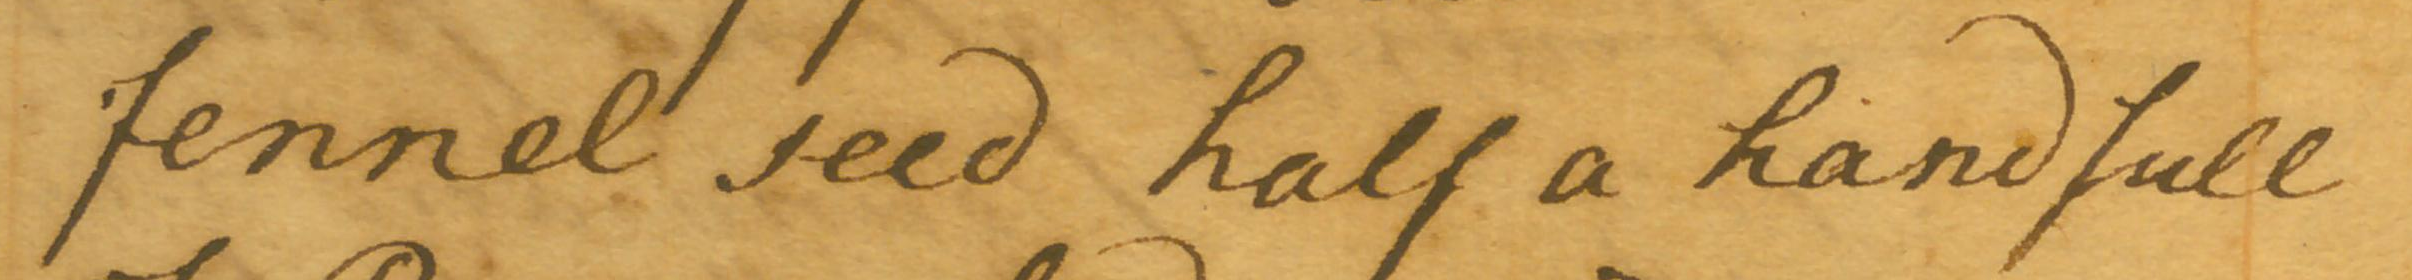fennel seed half a handfull
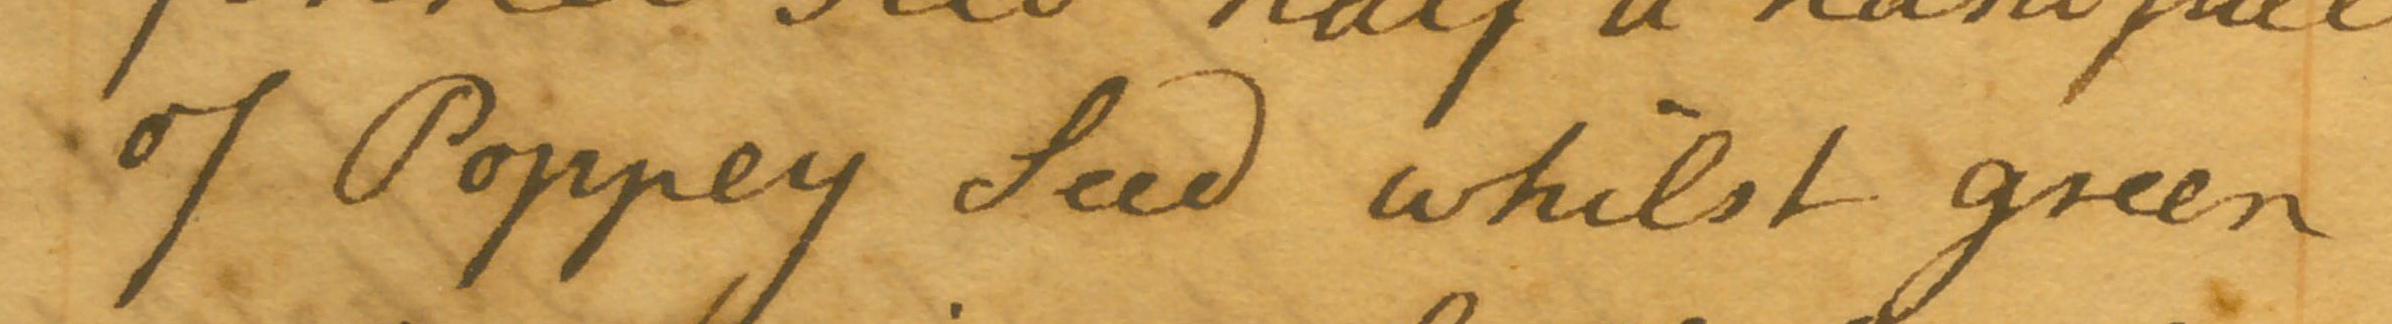of Poppey seed whilst green
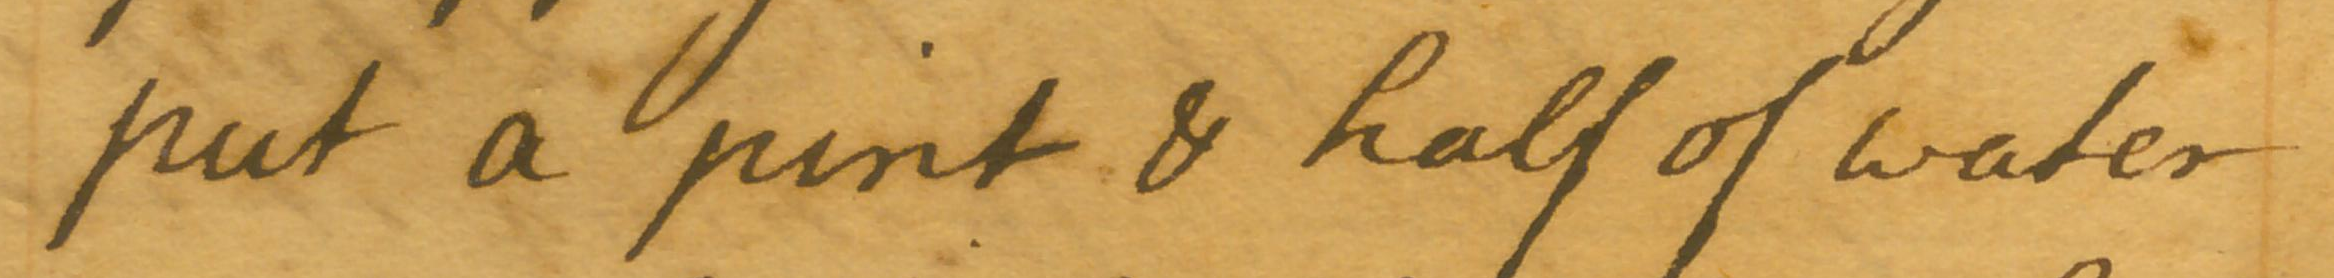put a pint & half of water
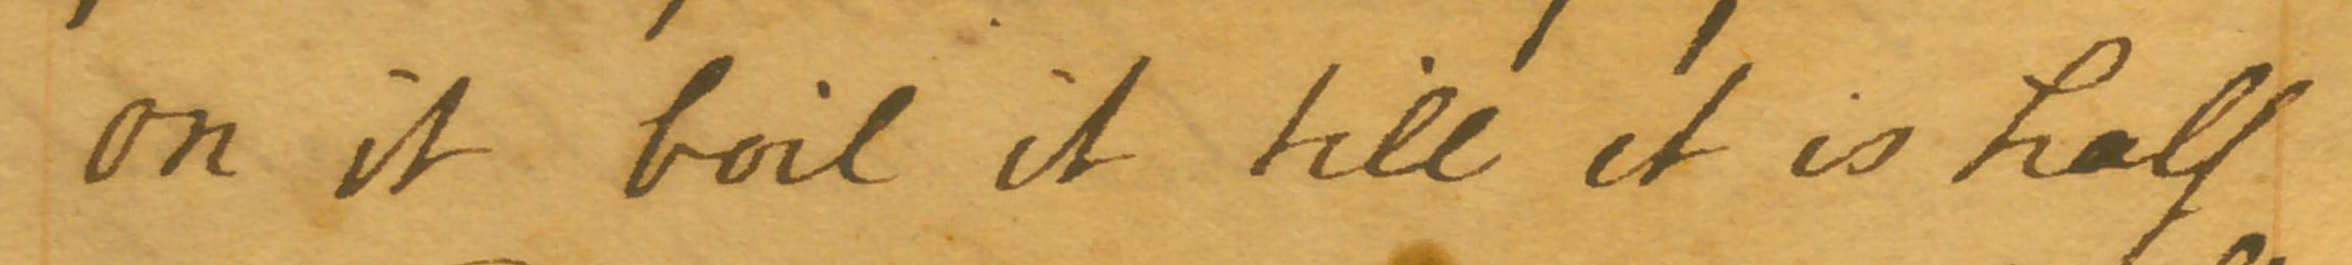on it boil it till it is half
